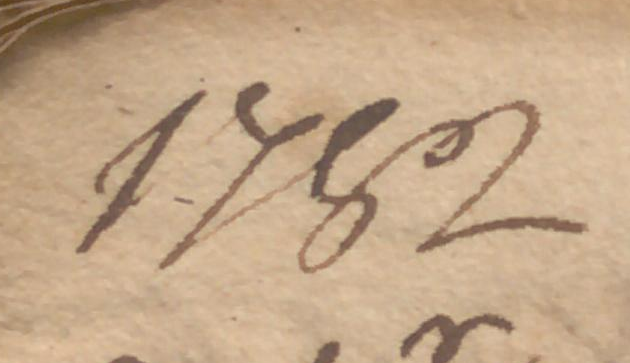1782
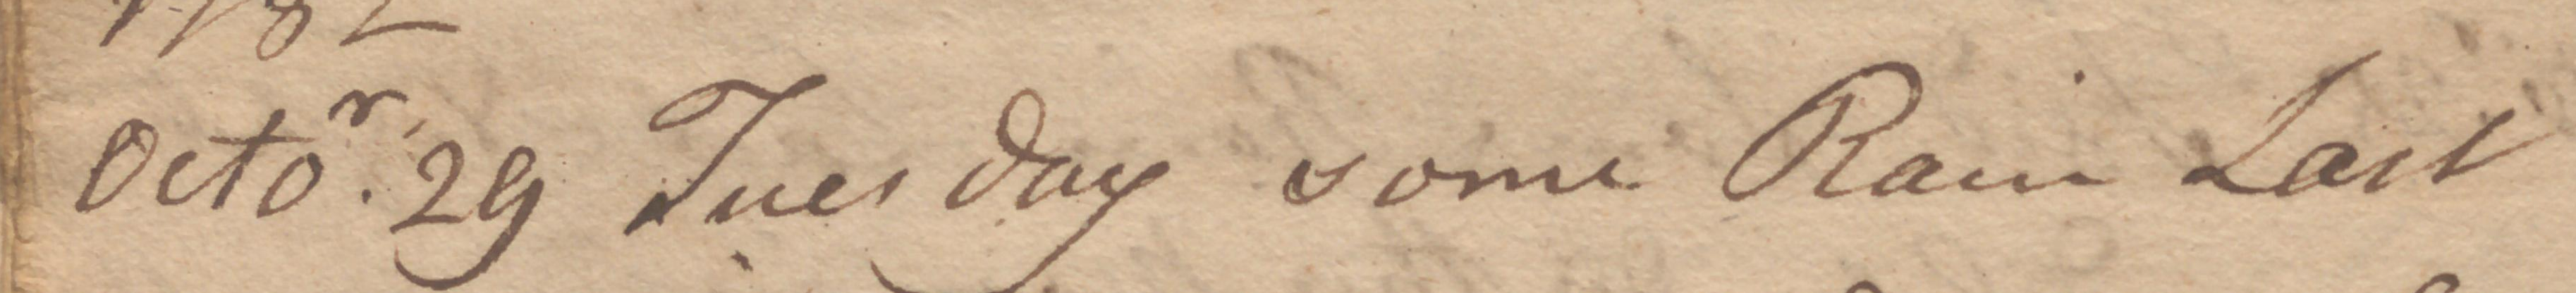Octo^r. 29 Tuesday some Rain Last
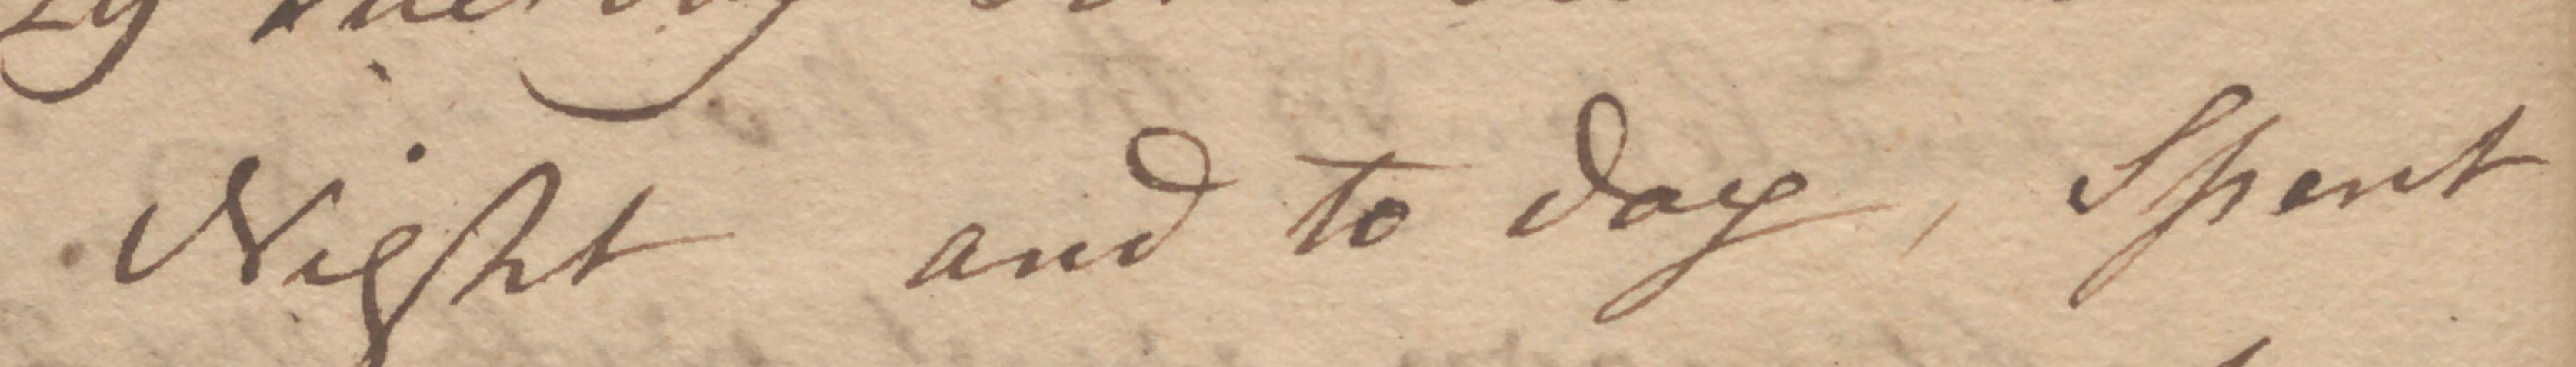Night and to day, Spent
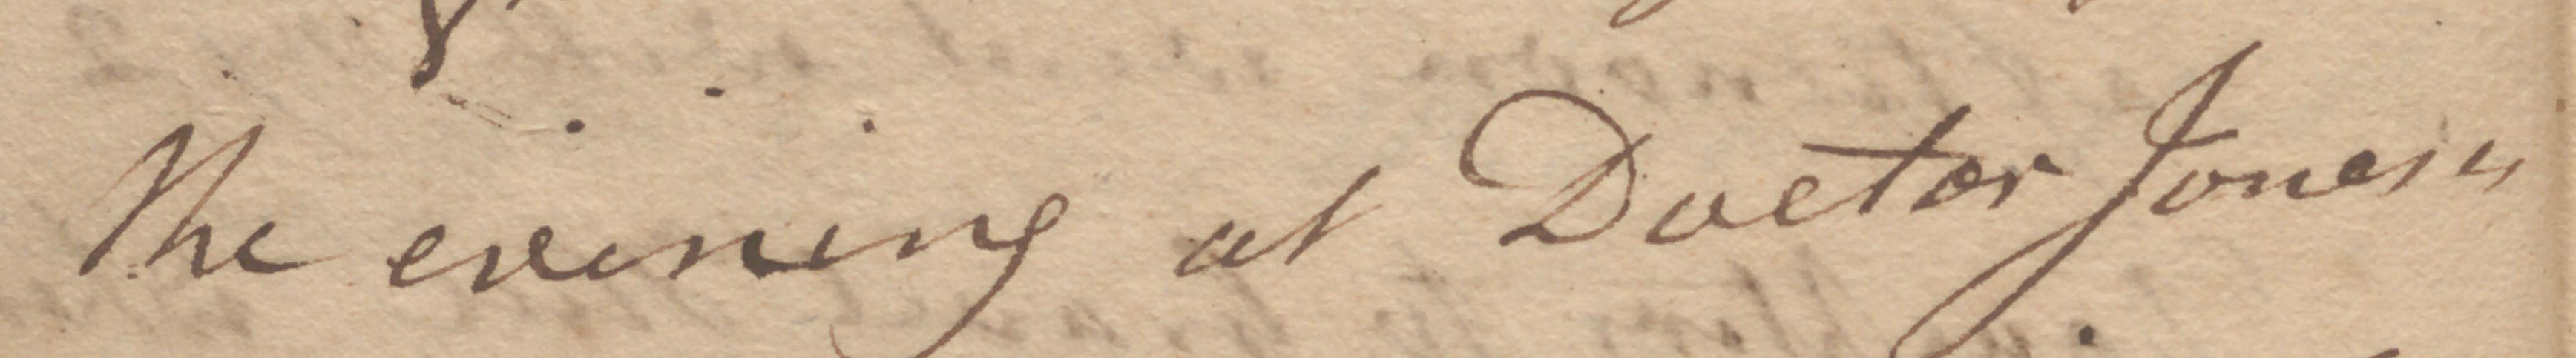the evening at Doctor Joneses
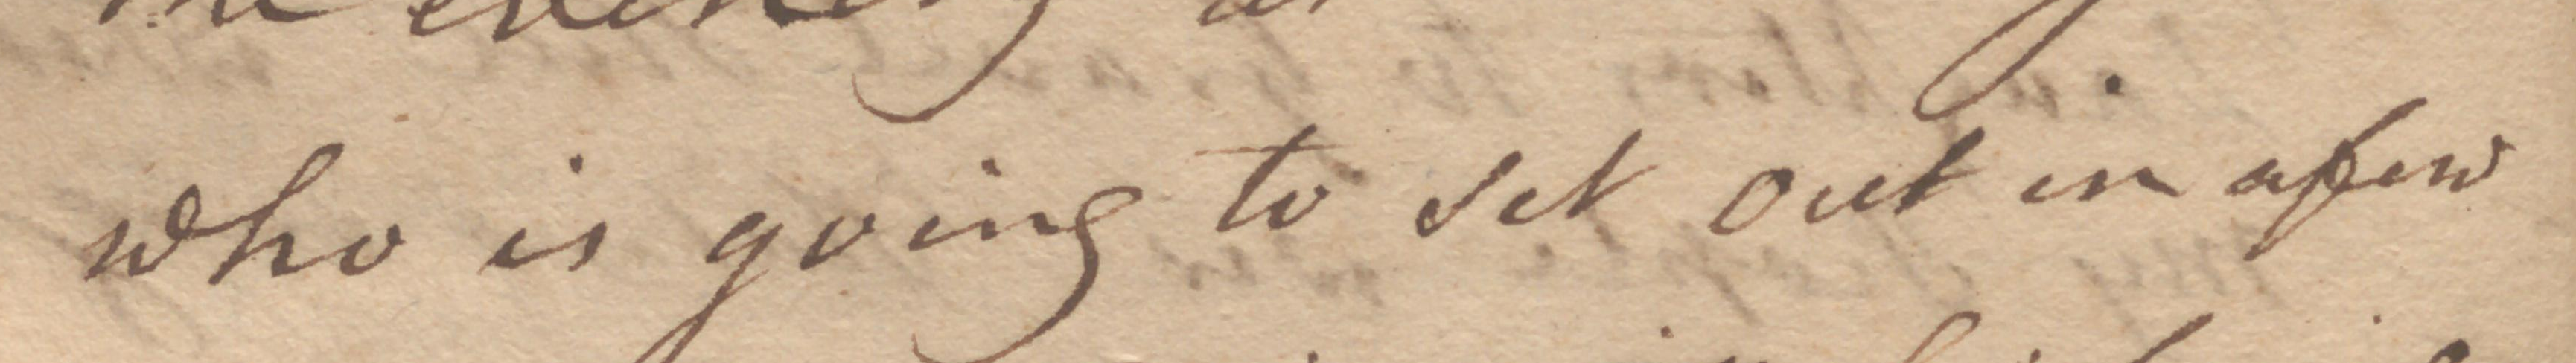who is going to set out in a few
